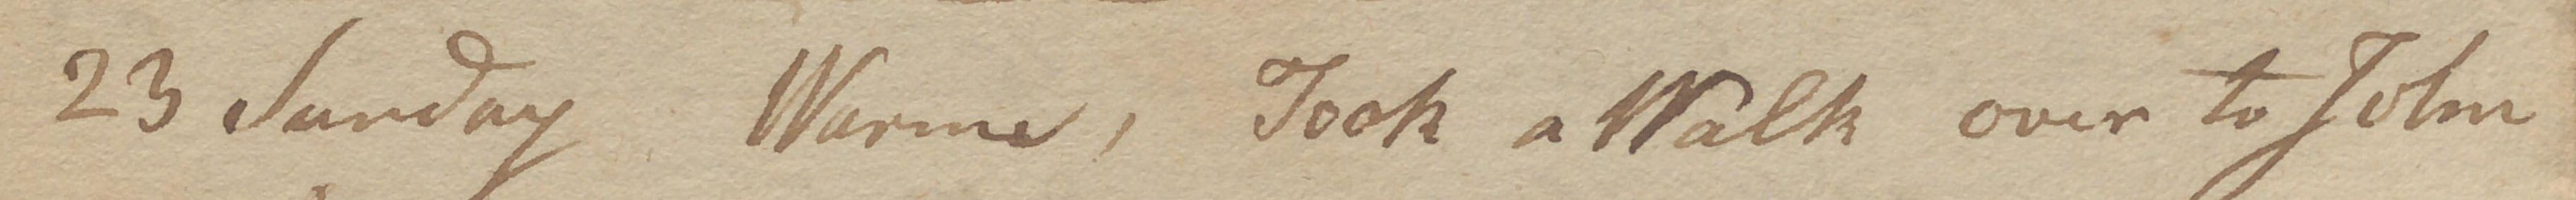23 Sunday Warme, Took a Walk over to John
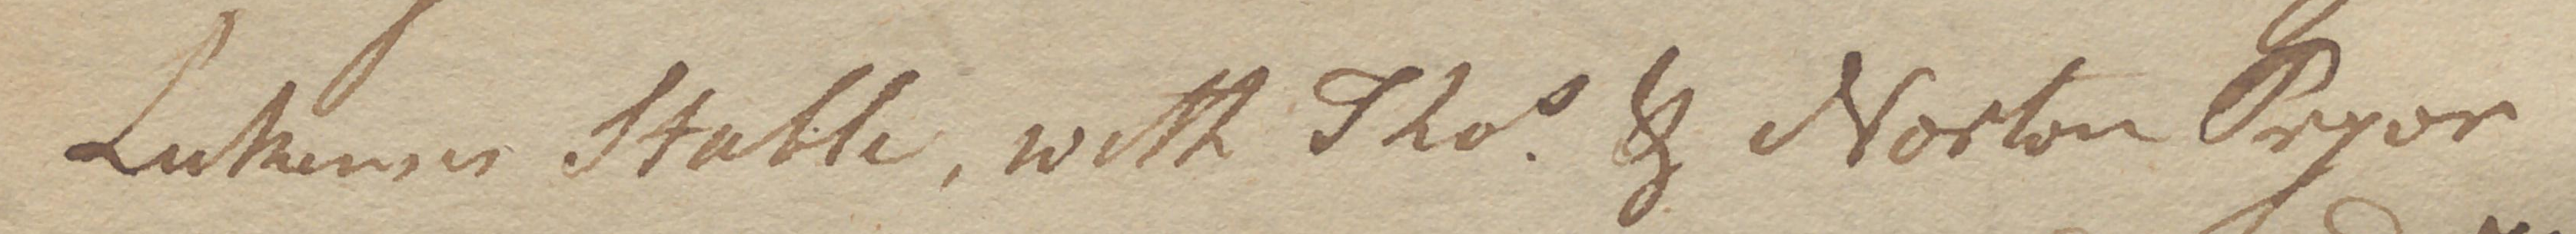Lukenses Stable, with Tho^s. & Norton Pryor
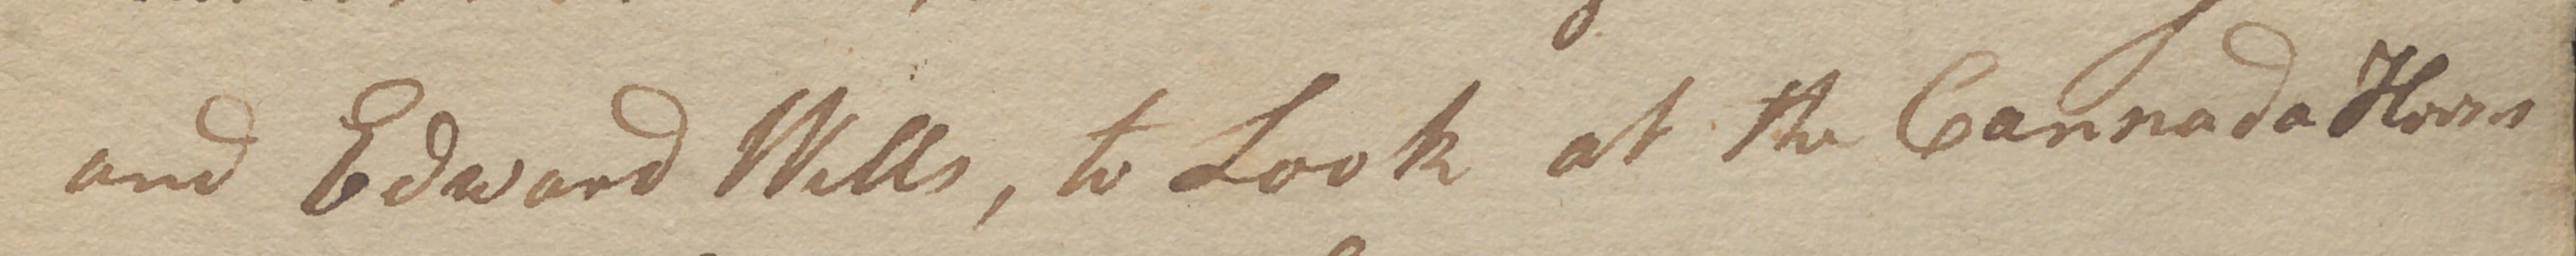and Edward Wills, to Look at the Cannada Horses
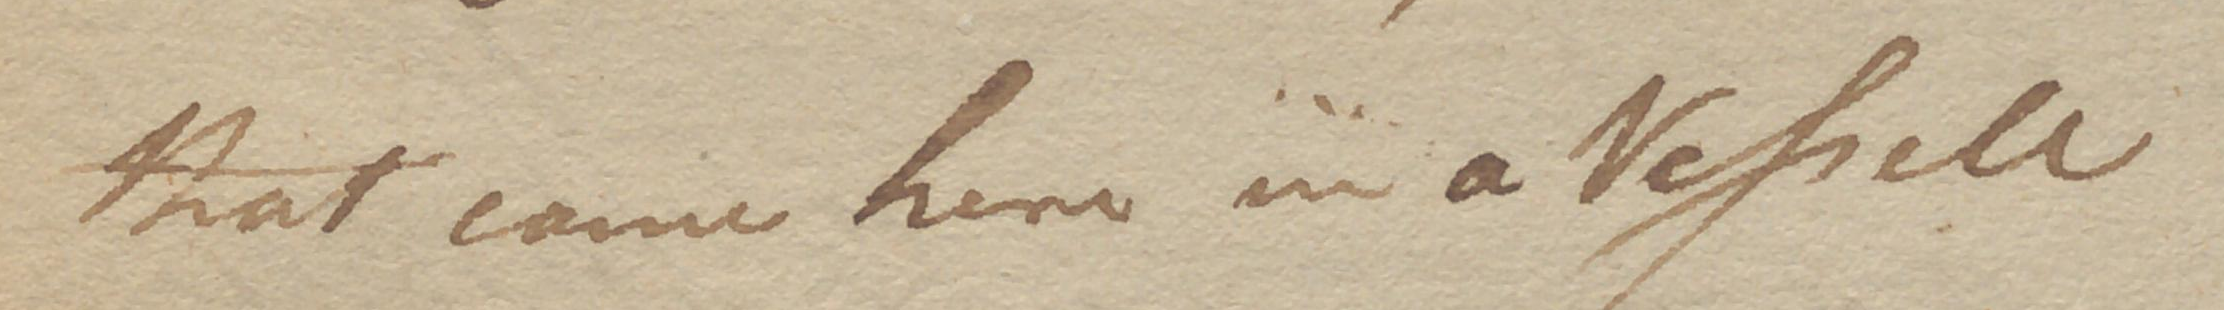that came here in a Vessell
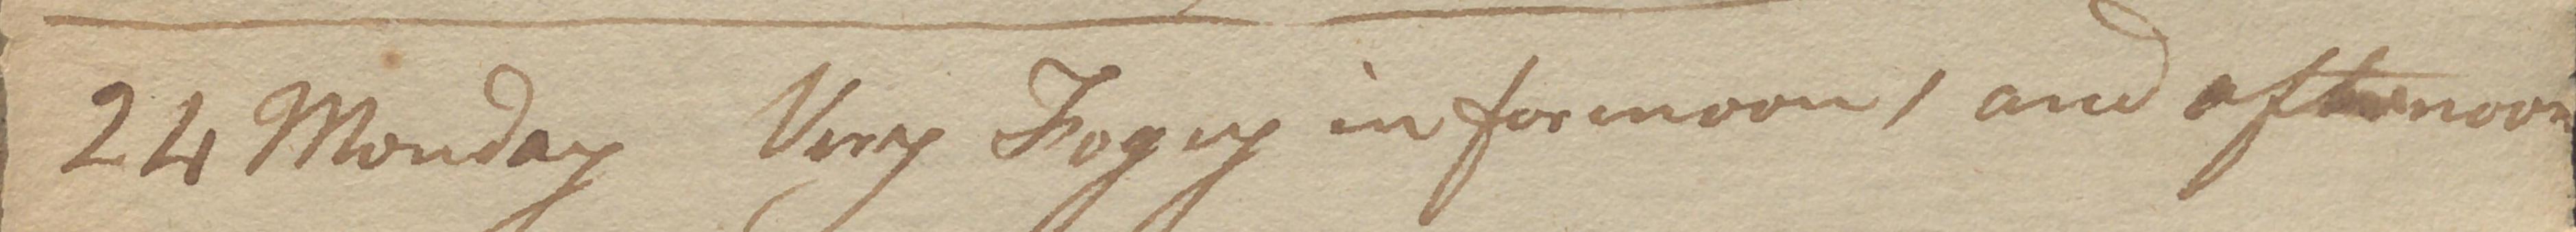24 Monday Venry Fogey in forenoon/ and afternoon
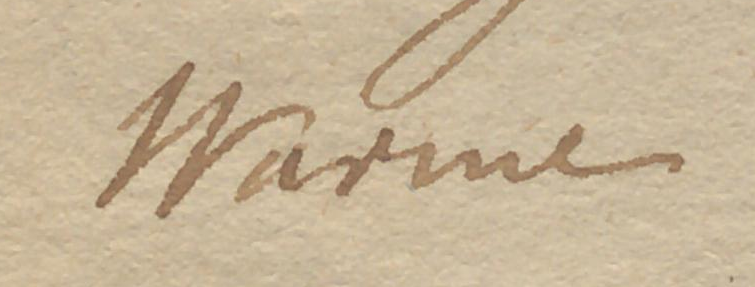Warme
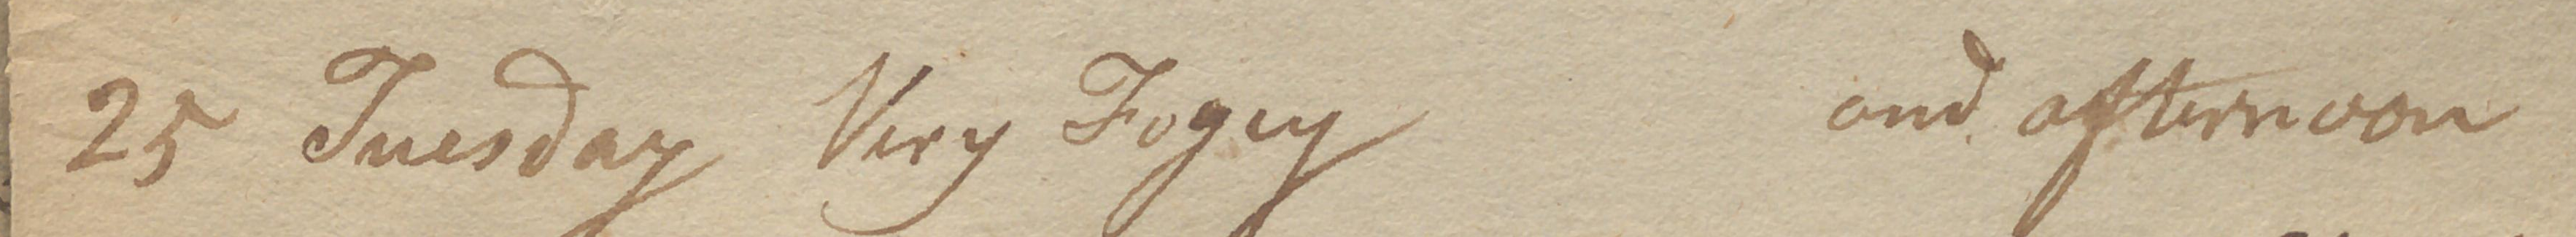25 Tuesday Very Fogey and afternoon
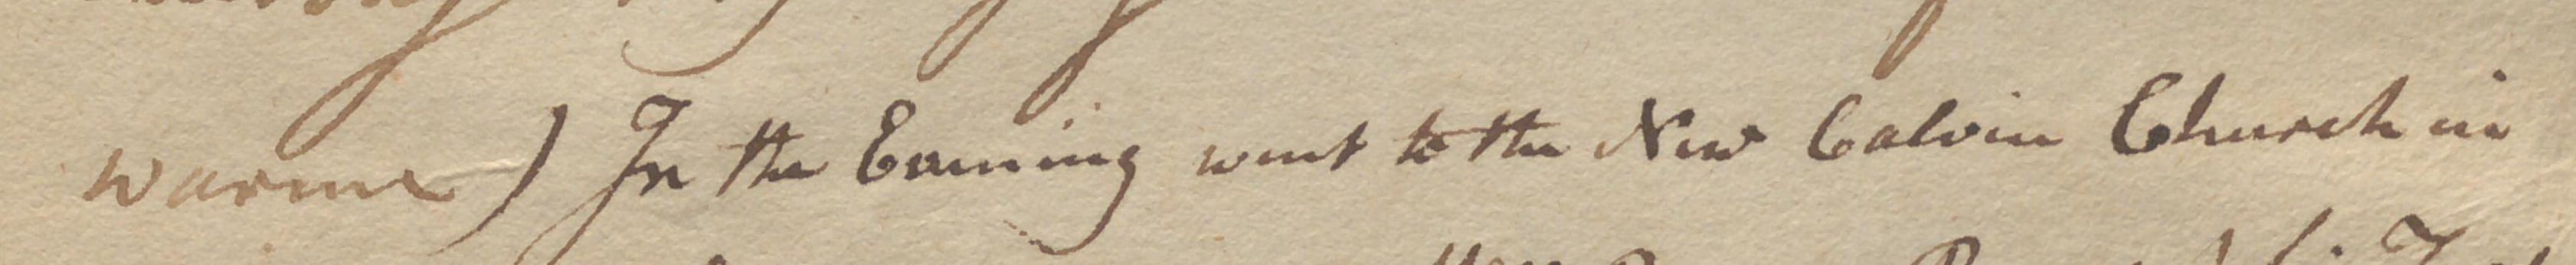warme) In the Evening went to the New Calvin Church in
